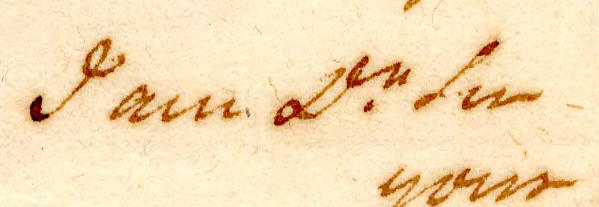I am D^r. Sir
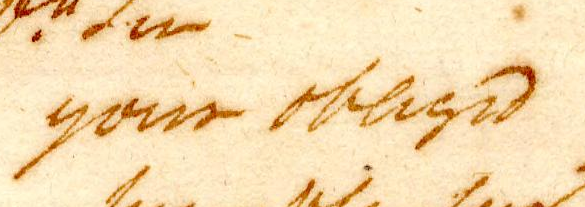your obliged
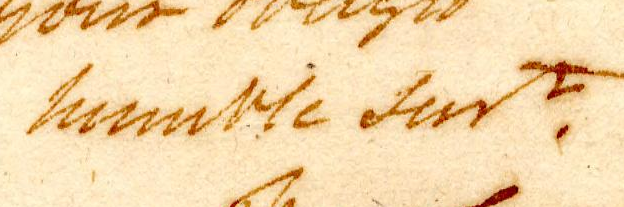humble Serv^t.
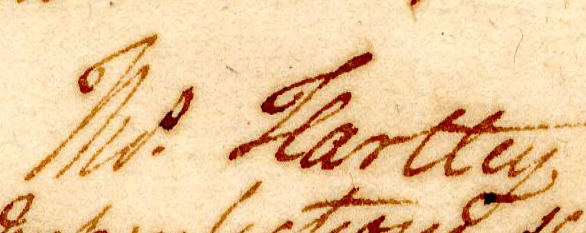Tho^s. Hartley
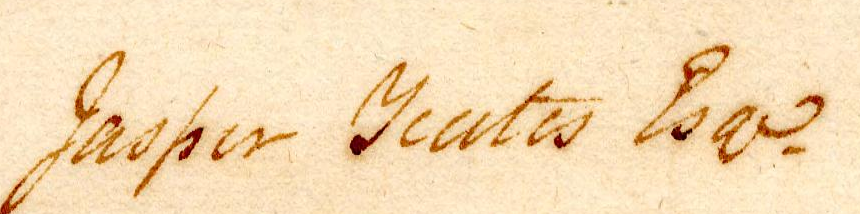Jasper Yeates Esq.
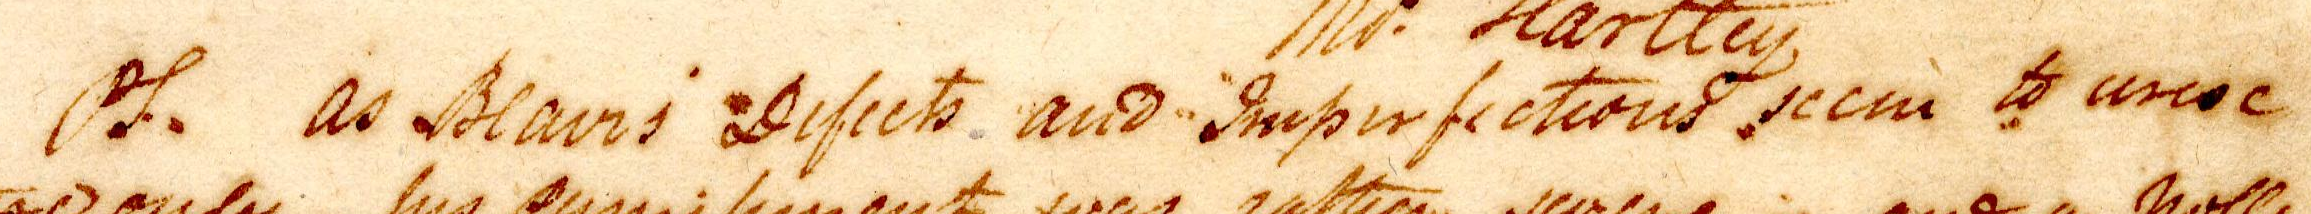PS. As Blair's Defects and Imperfections seem to arise
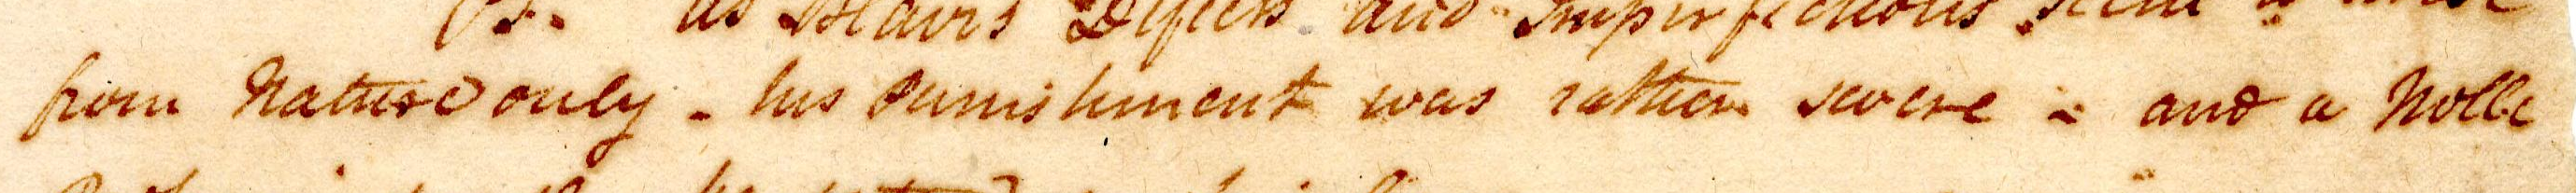from Nature only. his punishment was raltion severe. and a noble
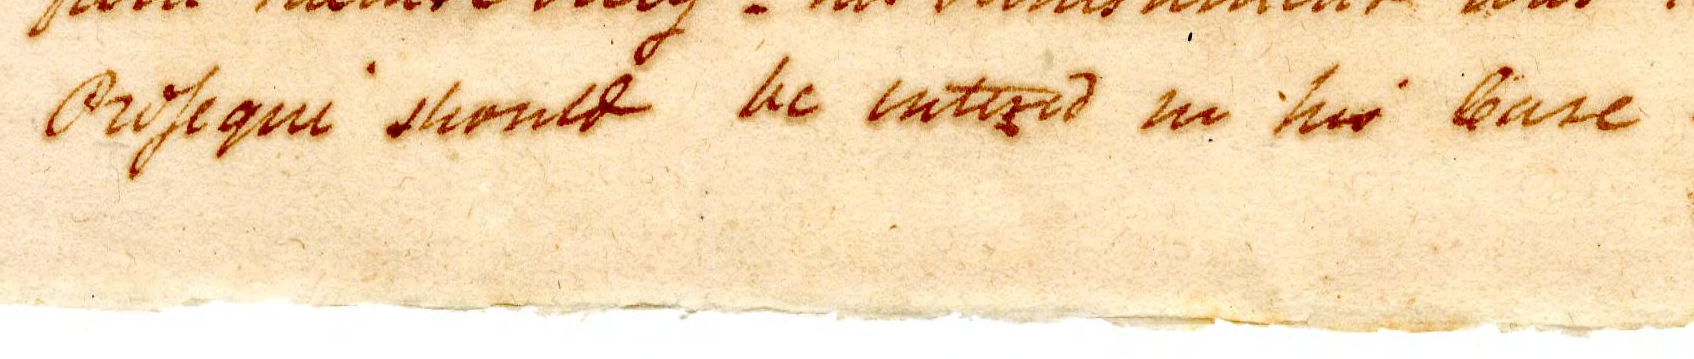Prosequi should be entered in his Case.
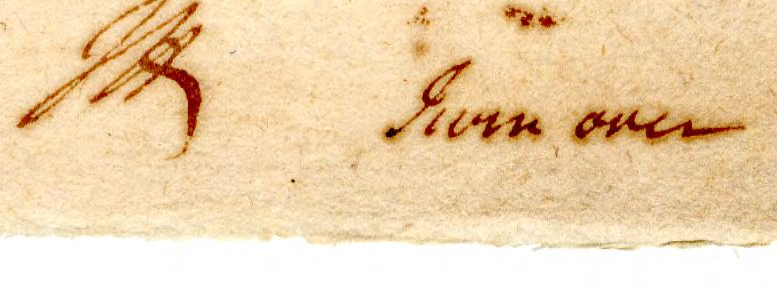TH Turn over
